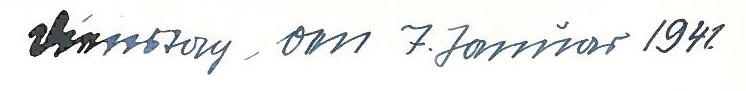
Dienstag, den 7. Januar 1941.
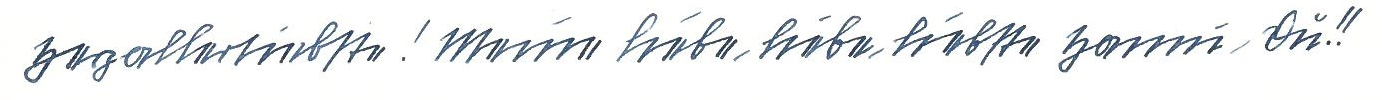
Herzallerliebste! Meine liebe, liebe, liebste , Du!!
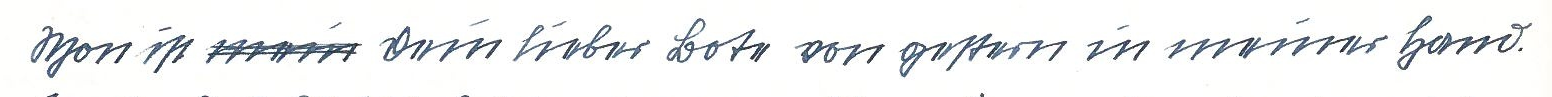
Schon ist mein Dein lieber Bote von gestern in meiner Hand.
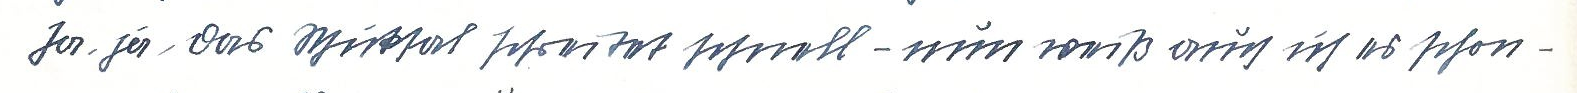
Ja, ja, das Schicksal schreitet schnell – nun weiß auch ich es schon –
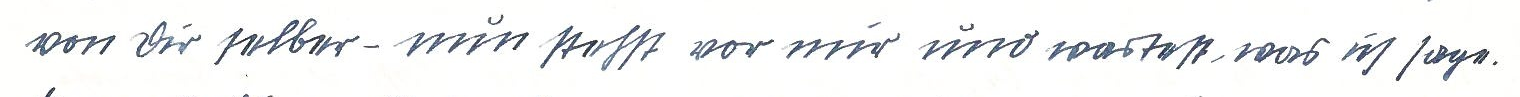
von Dir selber – nun stehst vor mir und wartest, was ich sage.
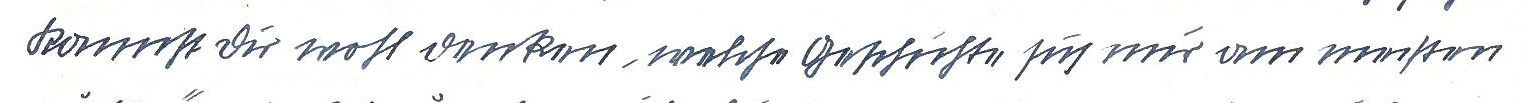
Kannst Dir wohl denken, welche Geschichte sich mir am meisten
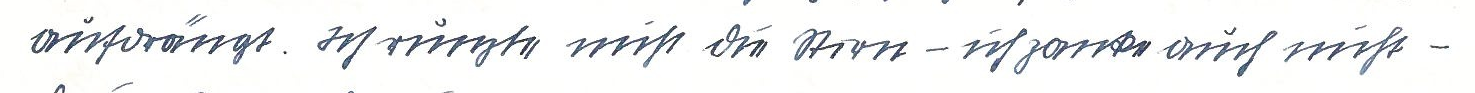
aufdrängt. Ich runzle nicht die Stirn – ich zanke auch nicht –
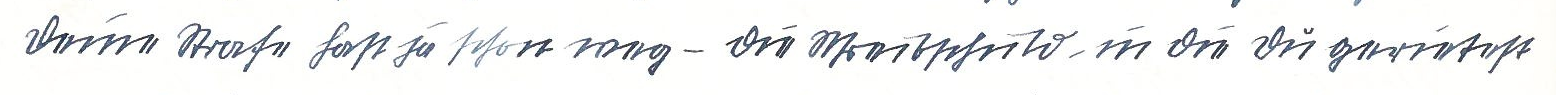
Deine Strafe hast ja schon weg – die Schreibschuld, in die Du gerietest
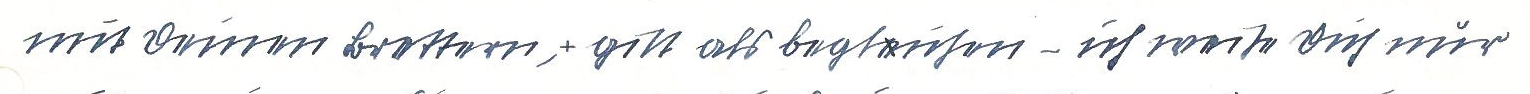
mit Deinen Brettern,– gilt als begleichen – ich weise Dich nur
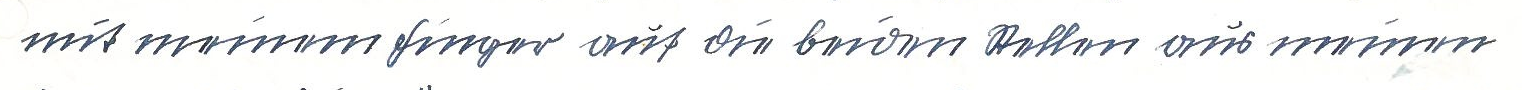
mit meinem Finger auf die beiden Stellen aus meinen
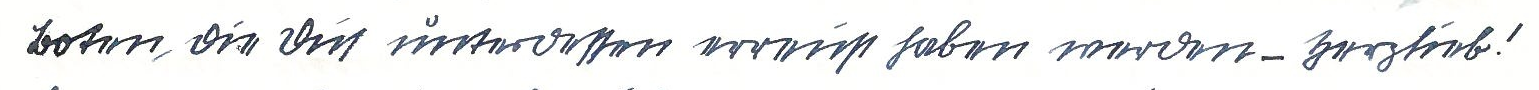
Boten, die Dich unterdessen erreicht haben werden – Herzlieb!
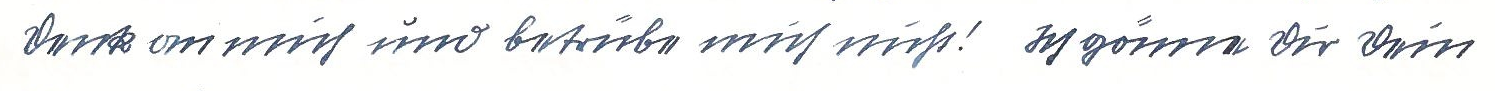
Denk an mich und betrübe mich nicht! Ich gönne Dir Dein
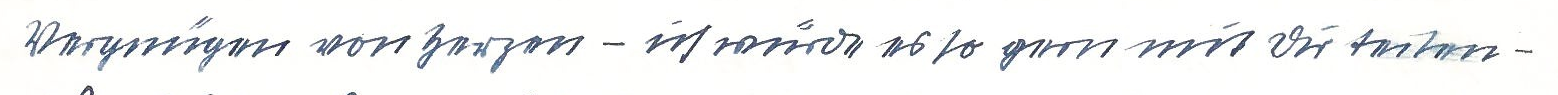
Vergnügen von Herzen – ich würde es so gern mit Dir teilen –
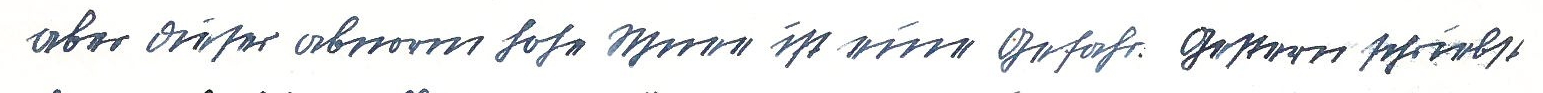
aber dieser abnorm hohe Schnee ist eine Gefahr. Gestern schriebst
